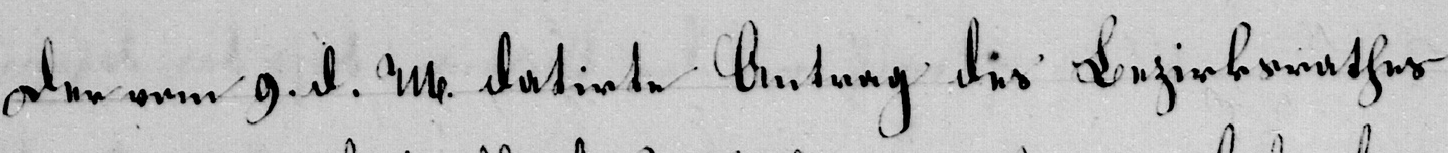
Der vom 9. d. M. datirte Antrag des Bezirksrathes
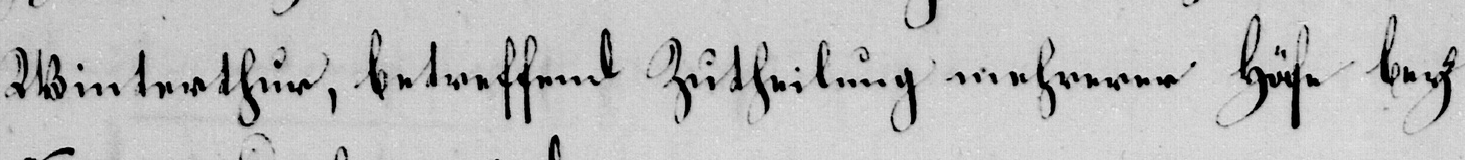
Winterthur, betreffend Zutheilung mehrerer Höfe bey
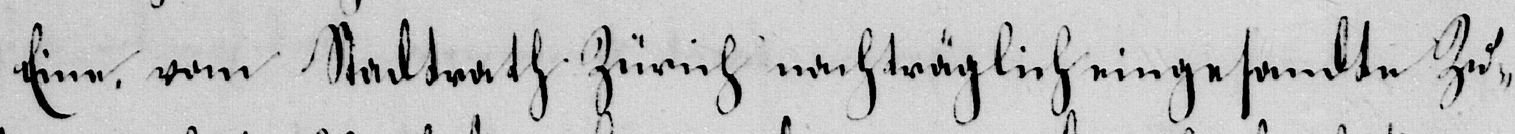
Eine vom Stadtrath Zürich nachträglich eingesandte Zu¬
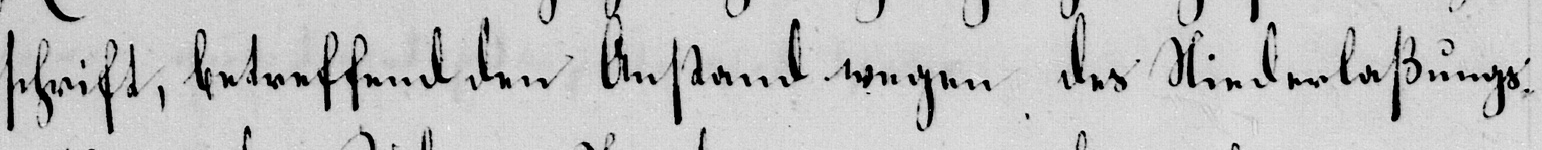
schrift, betreffend den Anstand wegen des Niederlaßungs¬
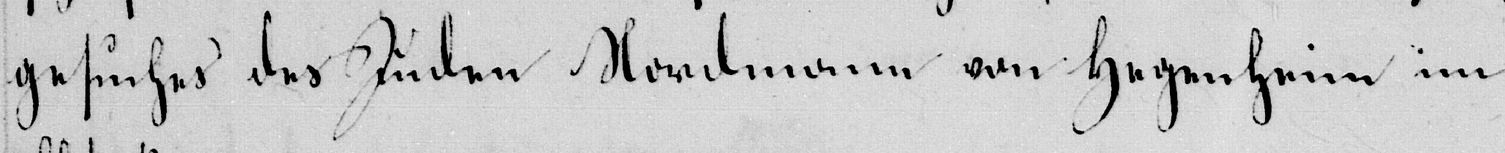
gesuches des Juden Nordmann von Hegenheim im
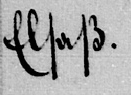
Elsaß.
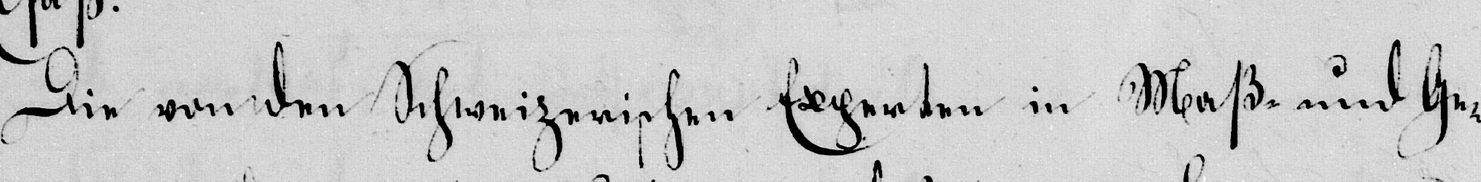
Die von den Schweizerischen Experten in Maß- und Ge¬
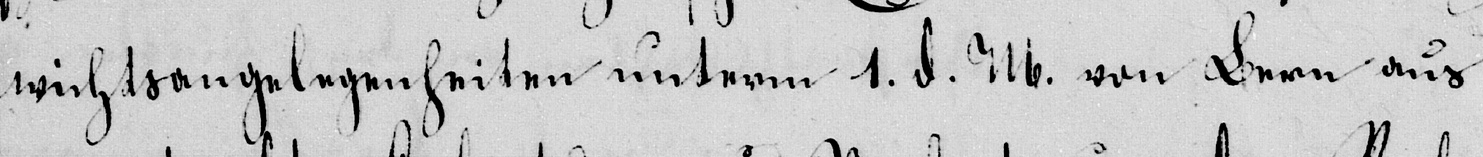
wichtsangelegenheiten unterm 1. d. M. von Bern aus
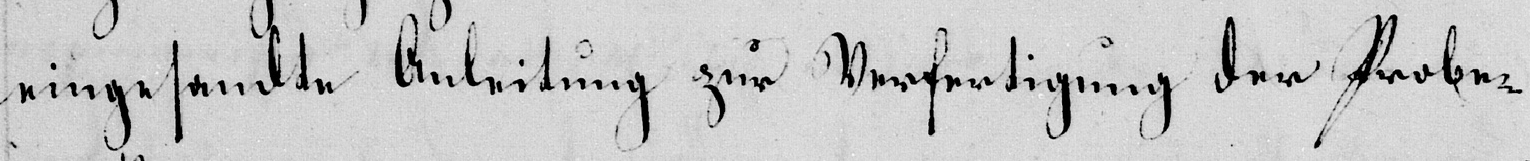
eingesandte Anleitung zur Verfertigung der Probe¬
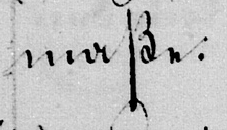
maße.
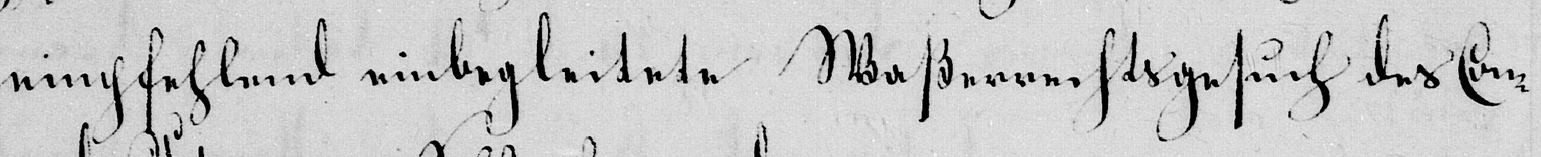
empfehlend einbegleitete Waßerrechtsgesuch des Con¬
